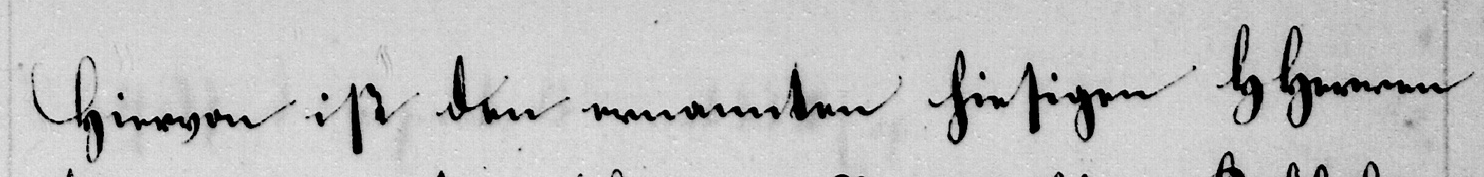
Hiervon ist den ernannten hiesigen HHerren
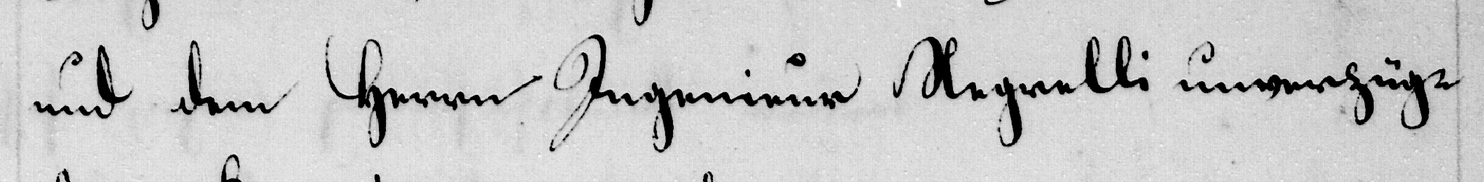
und dem Herrn Ingenieur Negrelli unverzüg¬
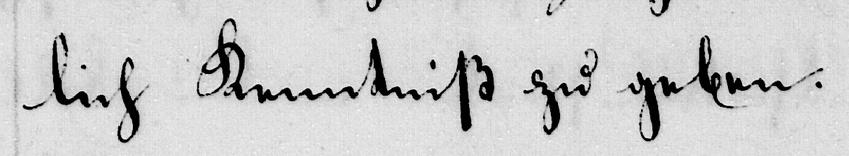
lich Kenntniß zu geben.
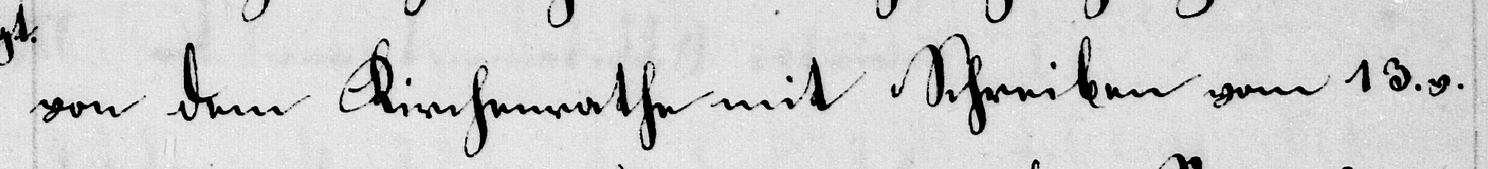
von dem Kirchenrathe mit Schreiben vom 13. v.
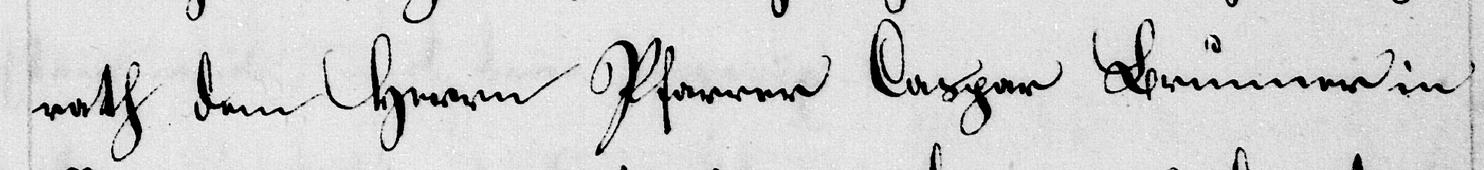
rath dem Herrn Pfarrer Caspar Brunner in
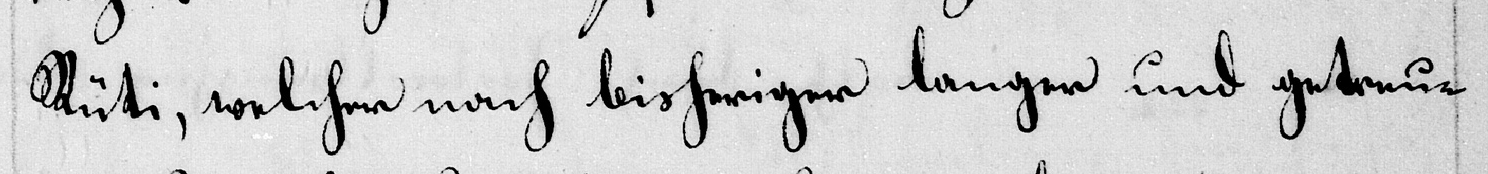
Rüti, welcher nach bisheriger langer und getreu¬
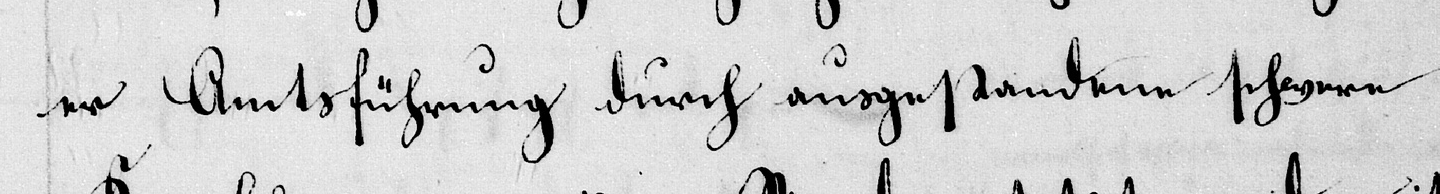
er Amtsführung durch ausgestandene schwere
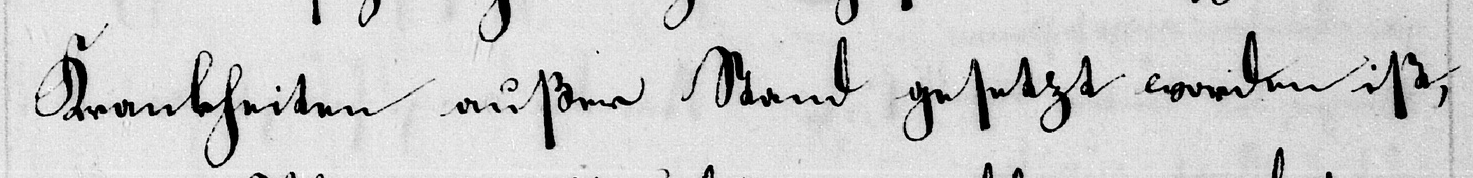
Krankheiten außer Stand gesetzt worden ist,
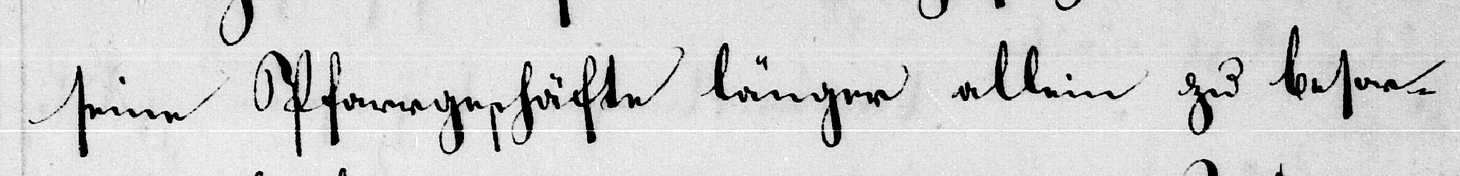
seine Pfarrgeschäfte länger allein zu besor¬
